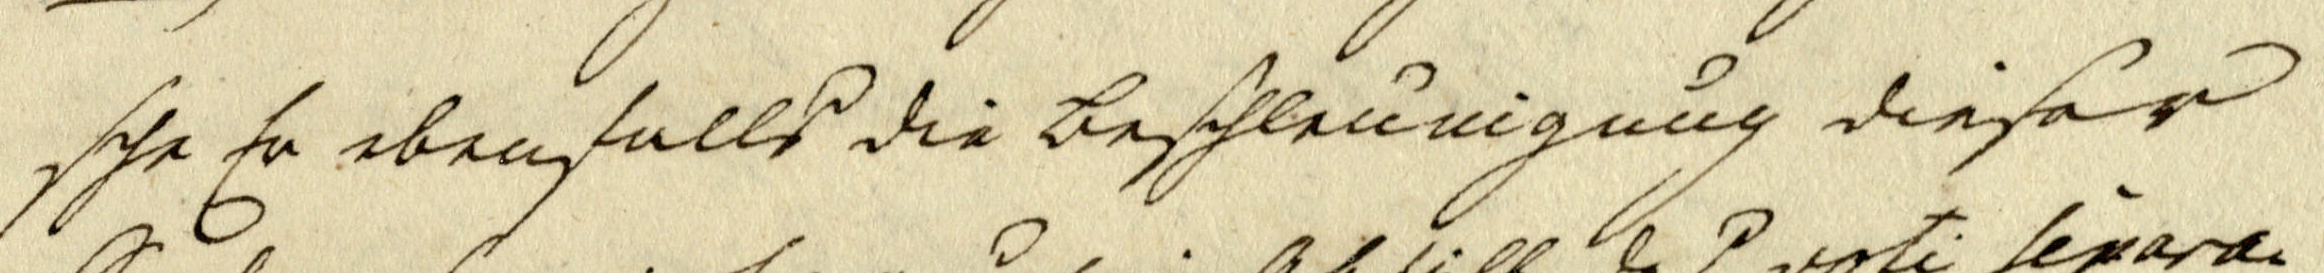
sche Er ebenfalls die Beschleunigung dieser
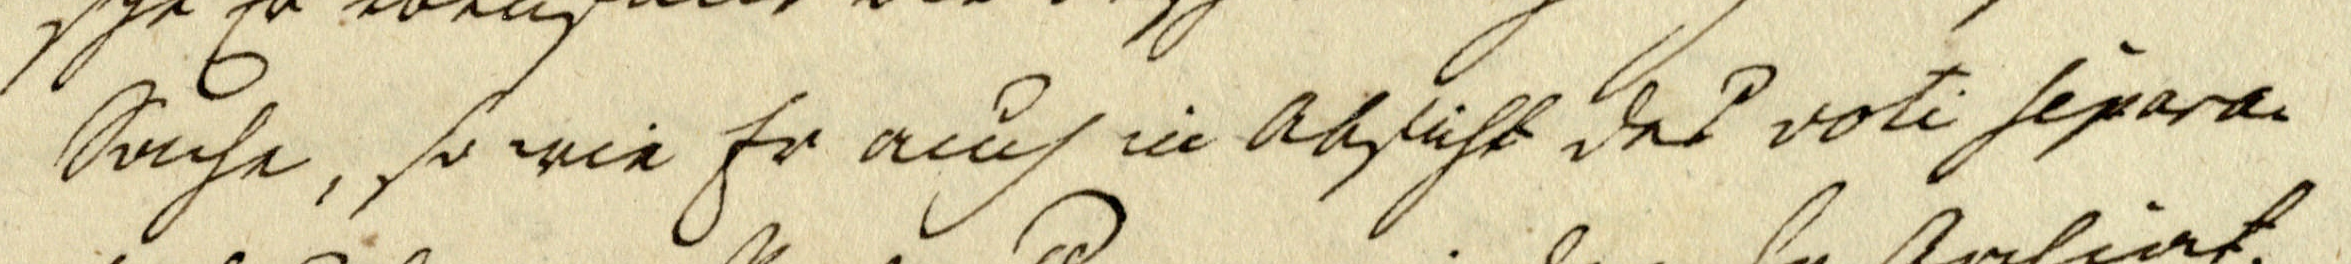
Sache, so wie Er auch in Absicht des voti separa¬
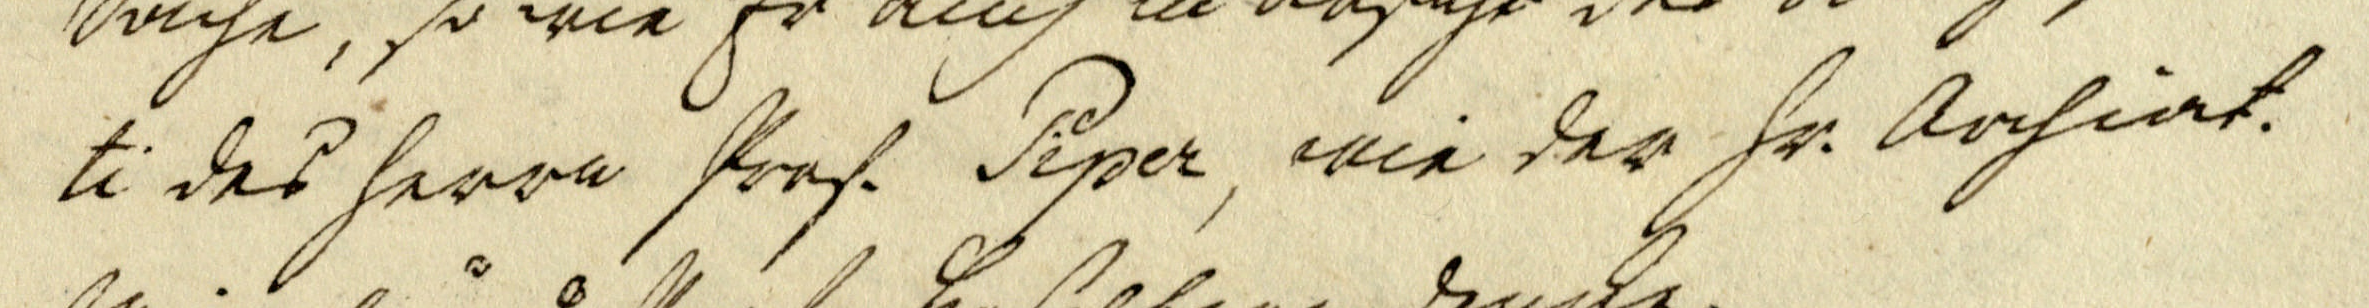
ti des Herrn Prof. Piper, wie der Hr Archiat.
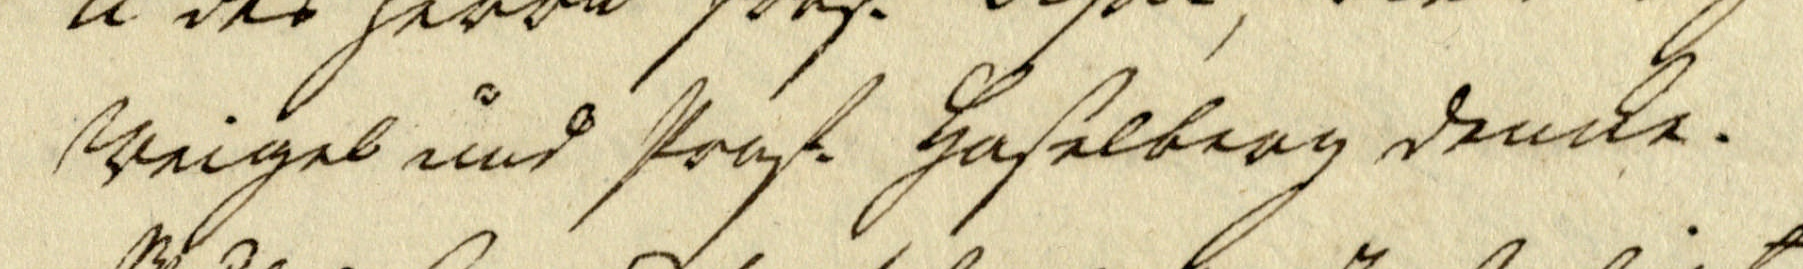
Weigel und Prof. Haselberg dencke.
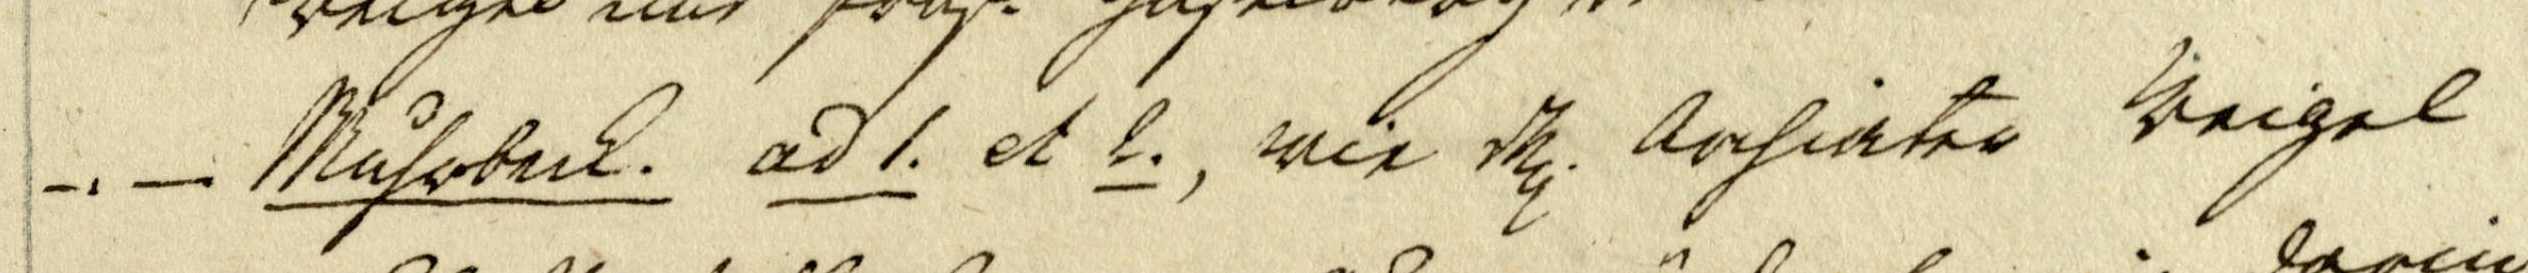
Muhrbeck. ad 1. et 2., wie dh. Archiater Weigel
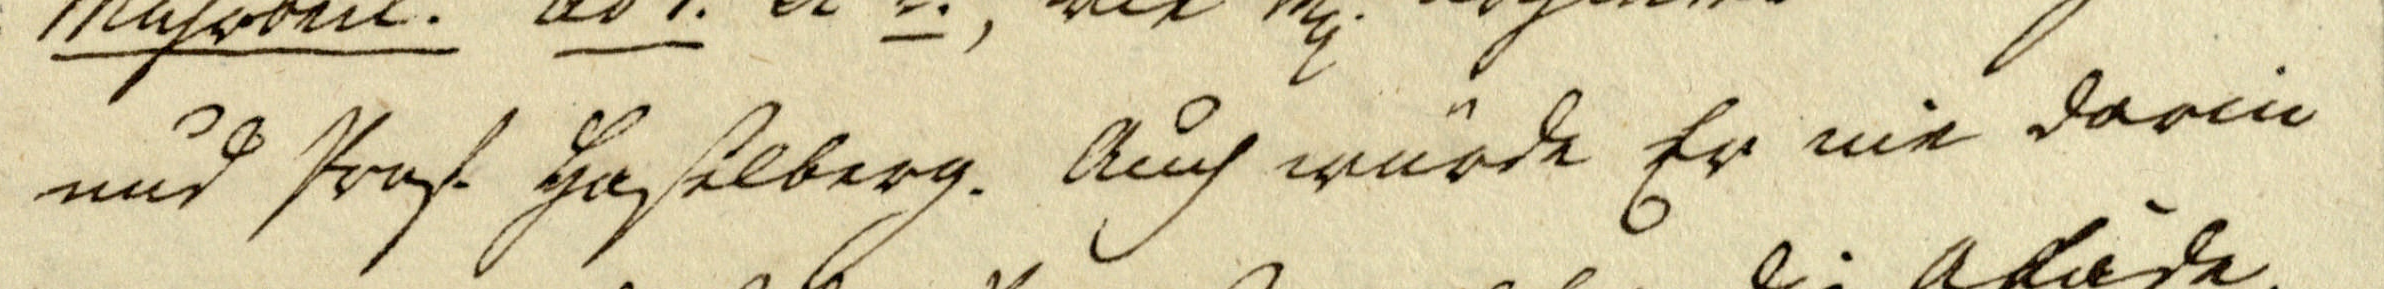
und Prof. Haselberg. Auch würde Er nie darin
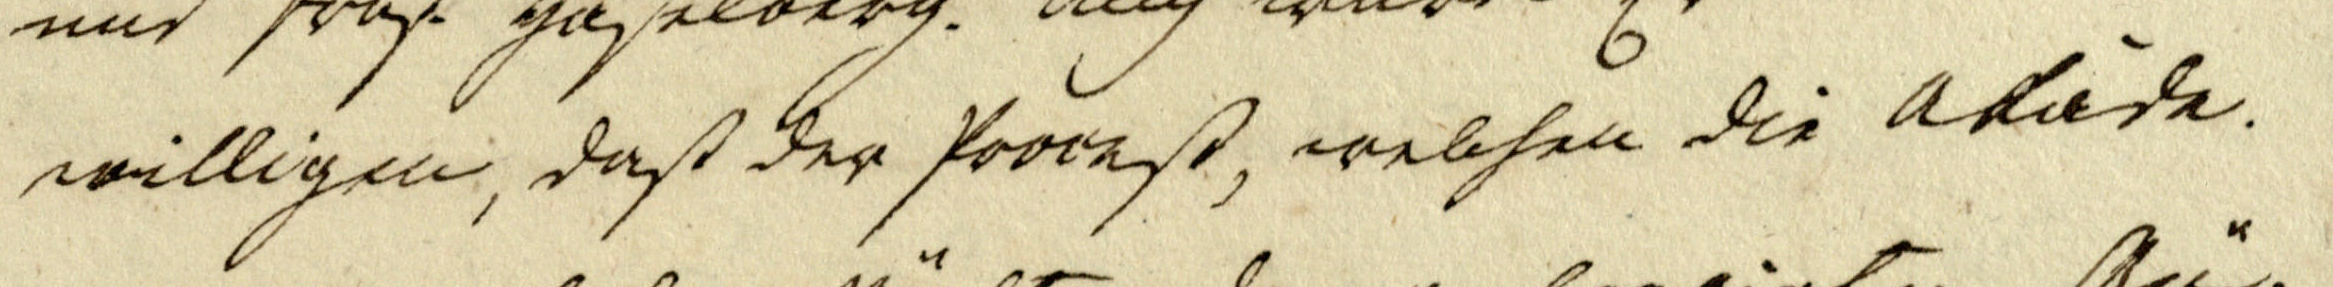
willigen, daß der Proceß, welchen die Akade¬
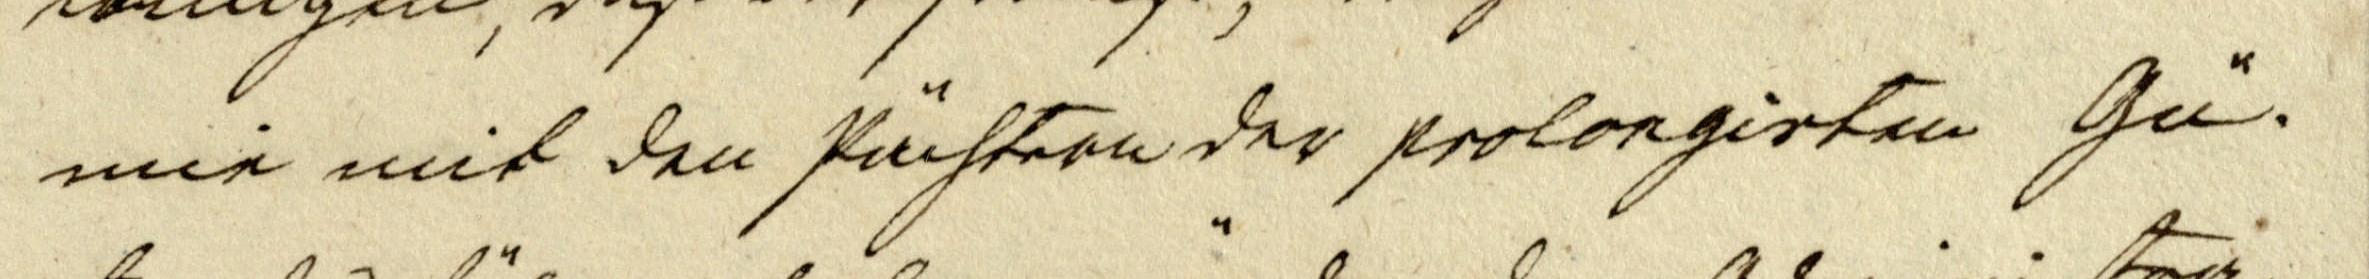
mie mit den Pächtern der prolongirten Gü¬
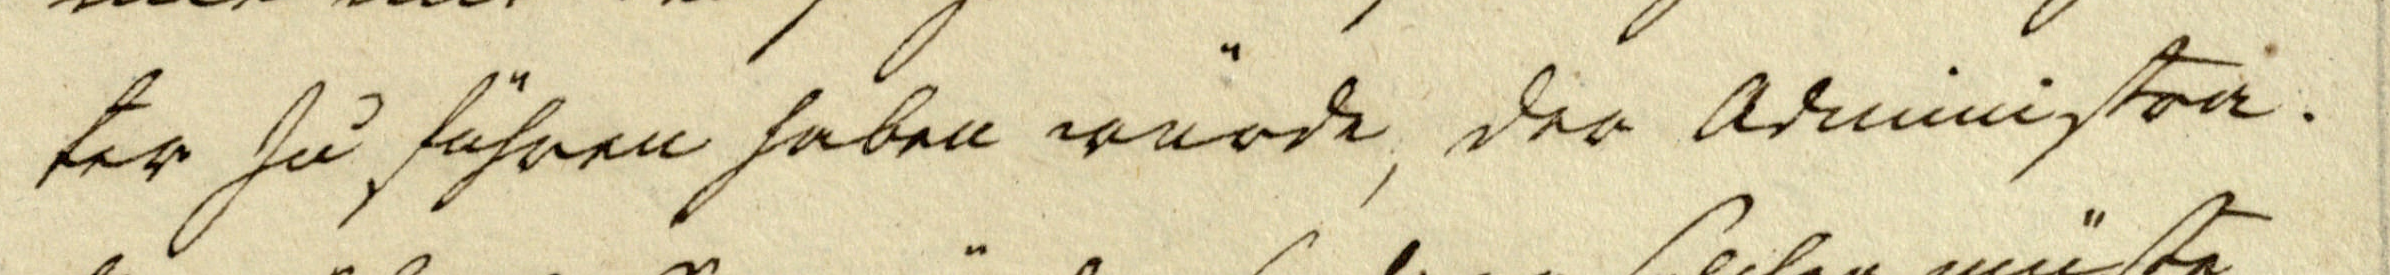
ter zu führen haben würde, der Administra¬
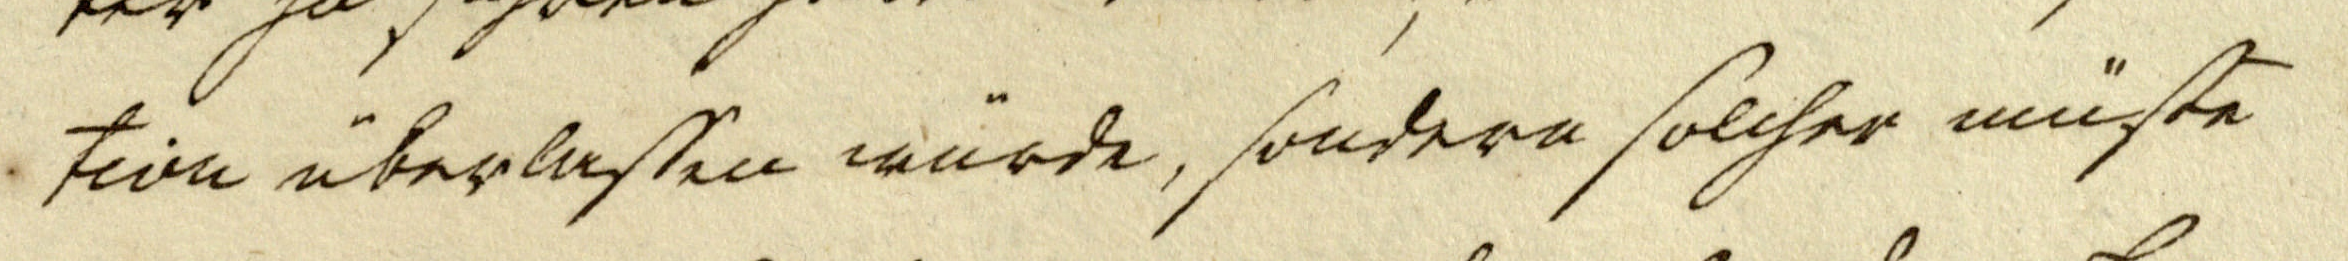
tion überlassen würde, sondern solcher müßte
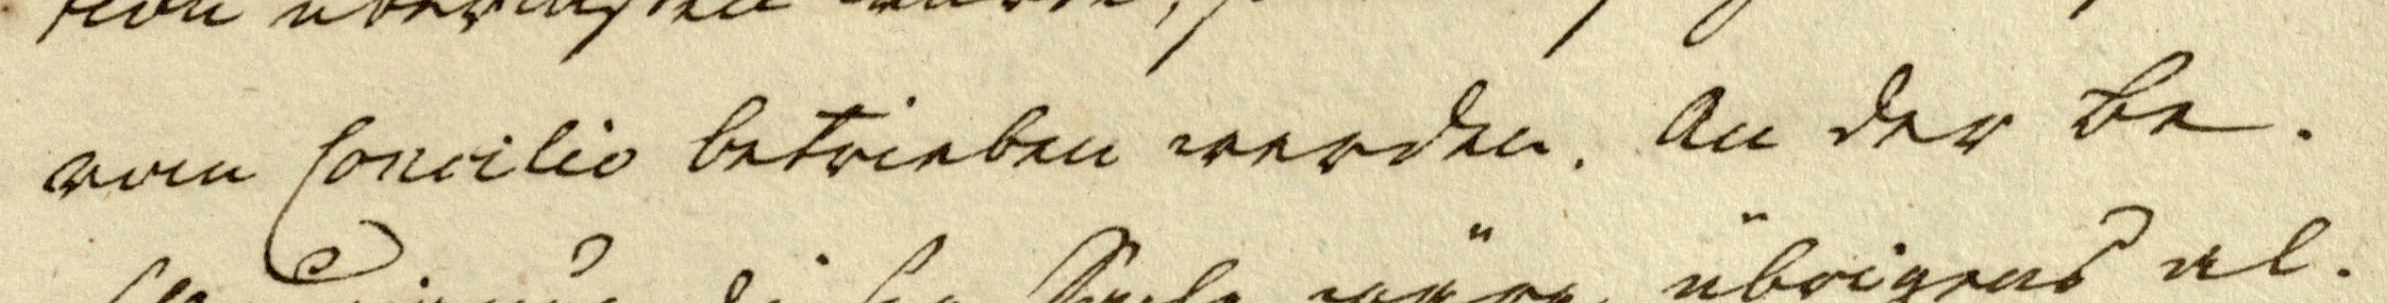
vom Concilio betrieben werden,. An der Be¬
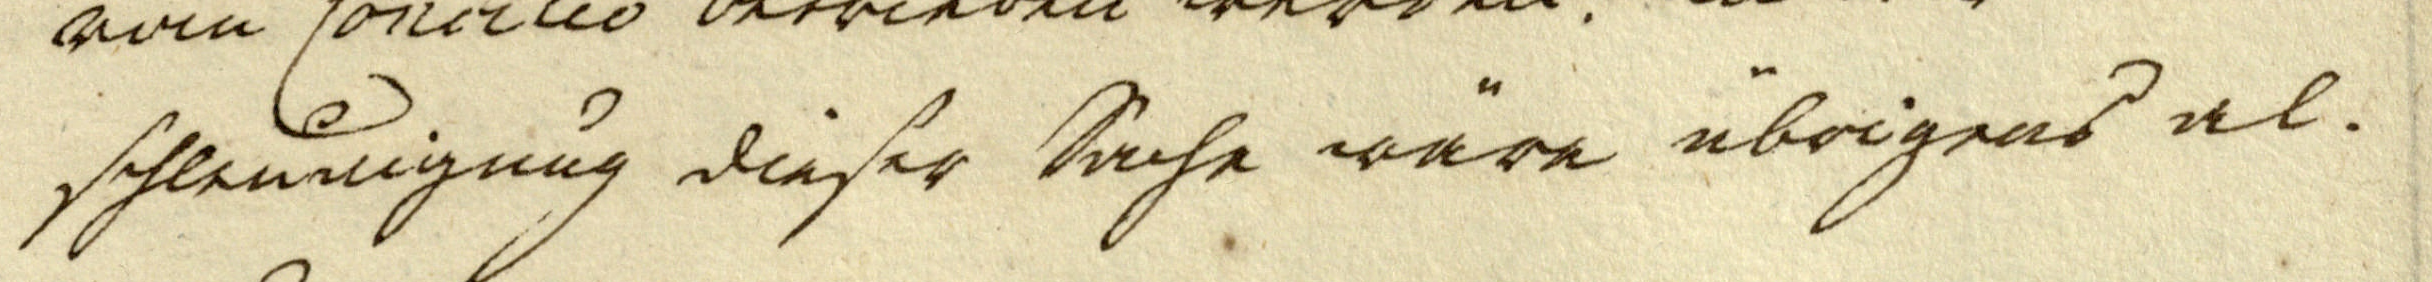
schleunigung dieser Sache wäre übrigens al¬
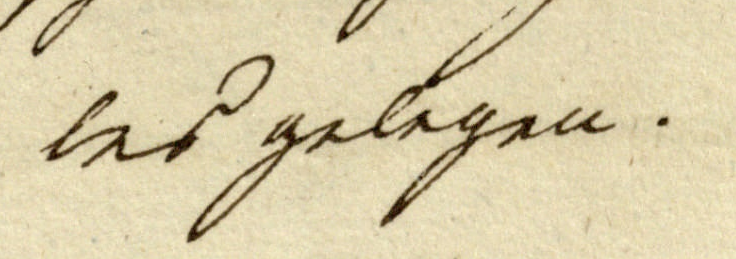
les gelegen.
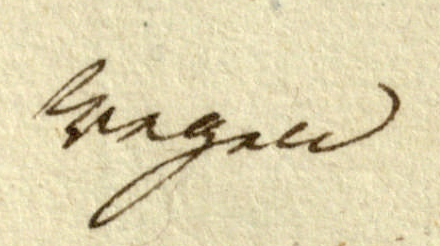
Wegen
